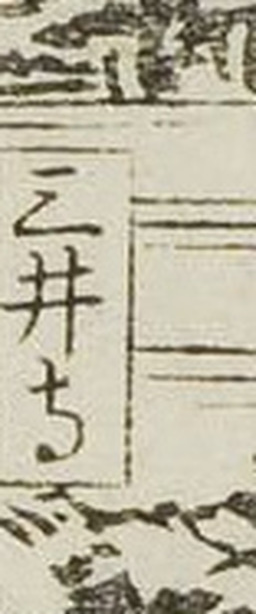三井寺
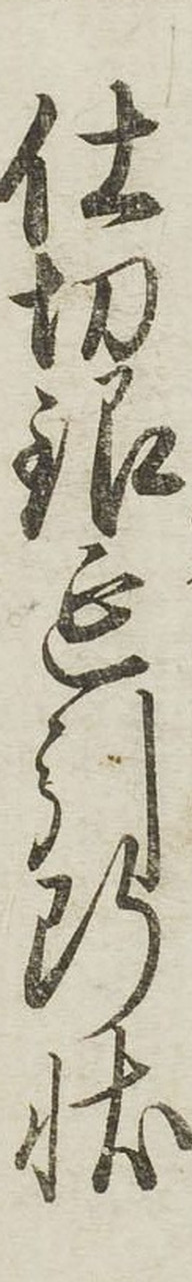仕切銀延引断状二十
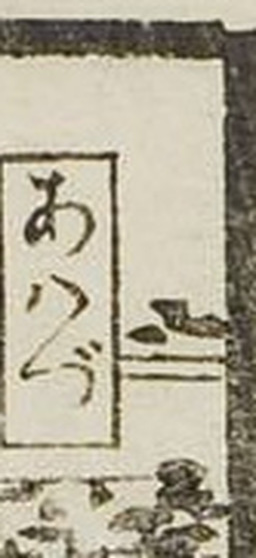あはづ
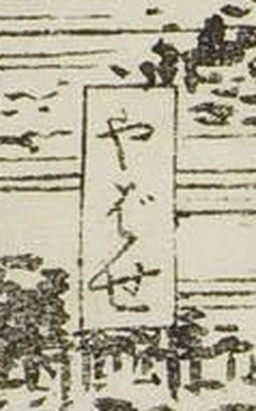やばせ
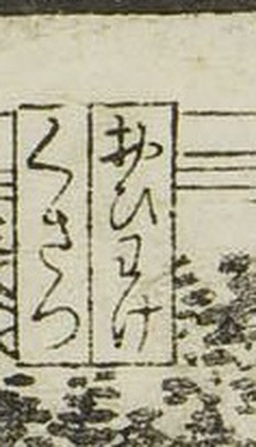おひわけ
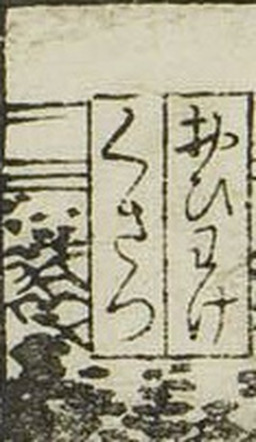くさつ

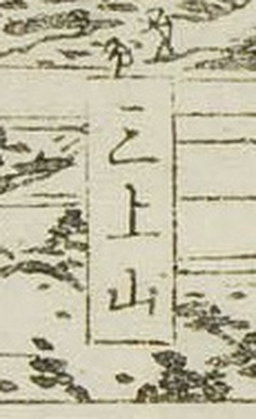三上山
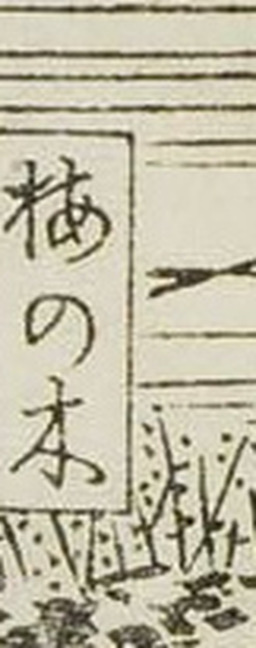梅の木
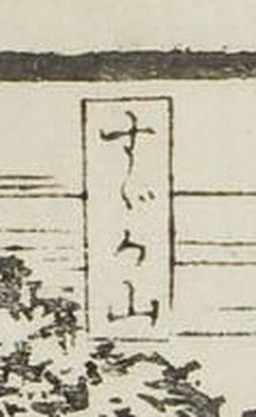すゞか山
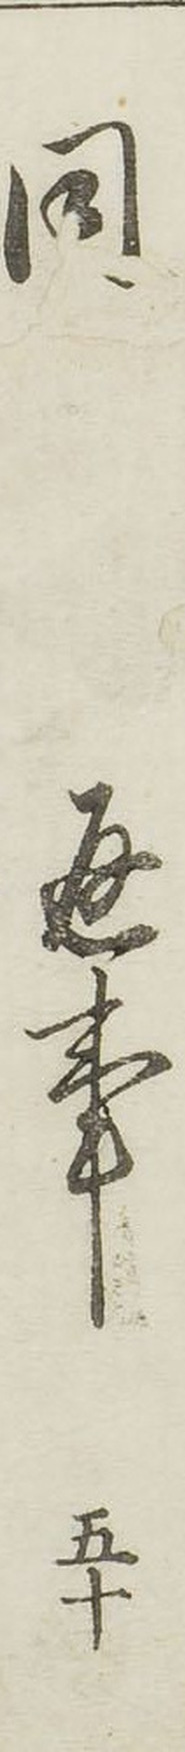同返事五十
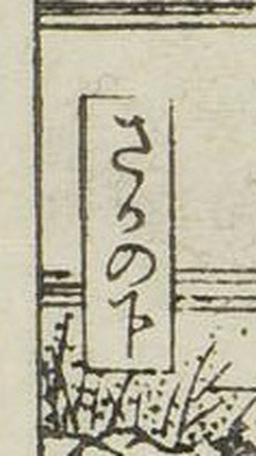さかの下

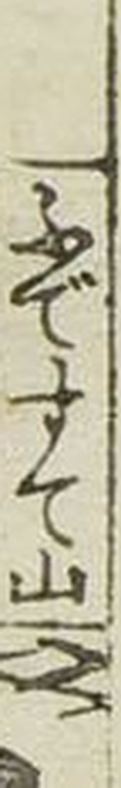ふですて山
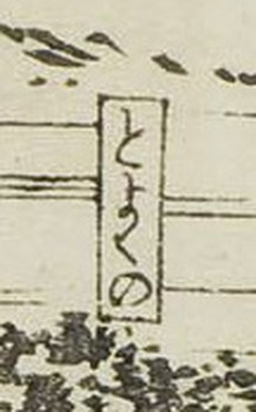とよくの
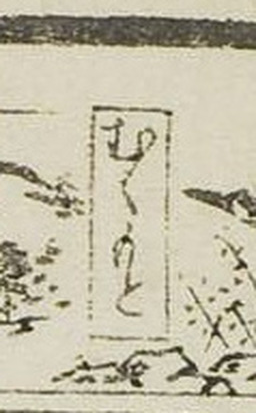むくもと
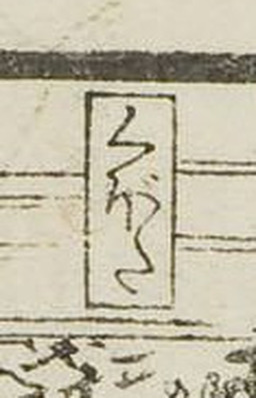くぼた
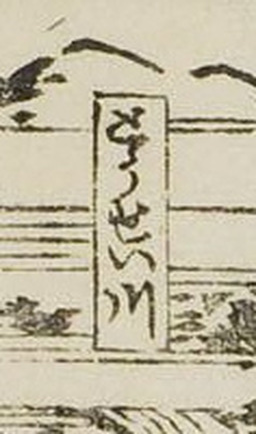とうせい川
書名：商人書翰便覧
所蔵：東京学芸大学教育コンテンツアーカイブ
